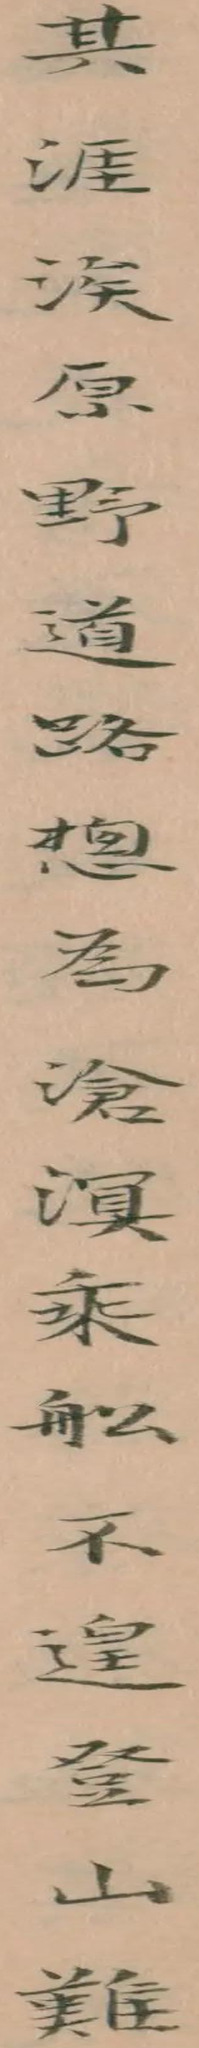其涯涘原野道路総為滄溟乗船不遑登山難
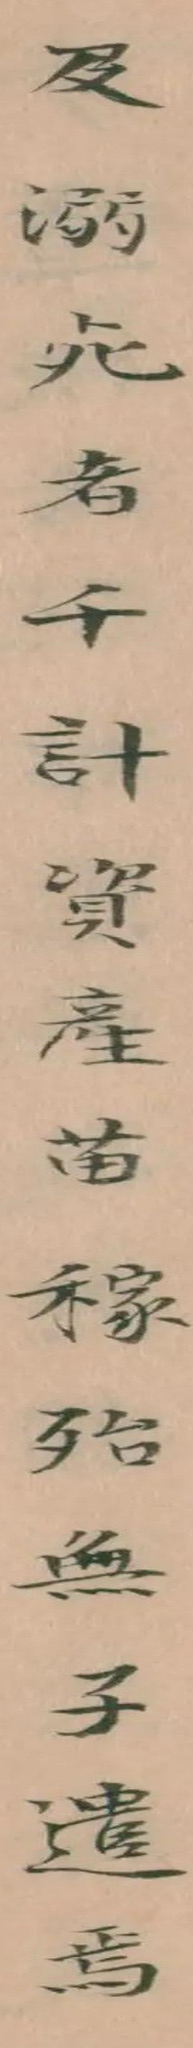及溺死者千計資産苗稼殆無子遣焉
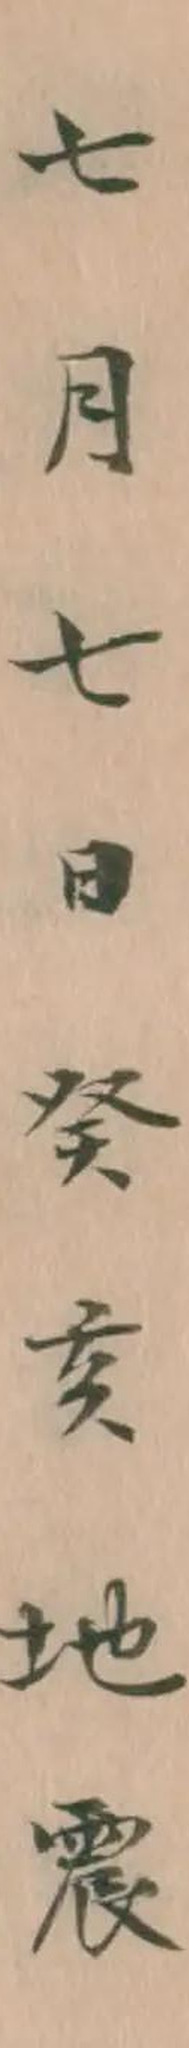七月七日癸亥地震
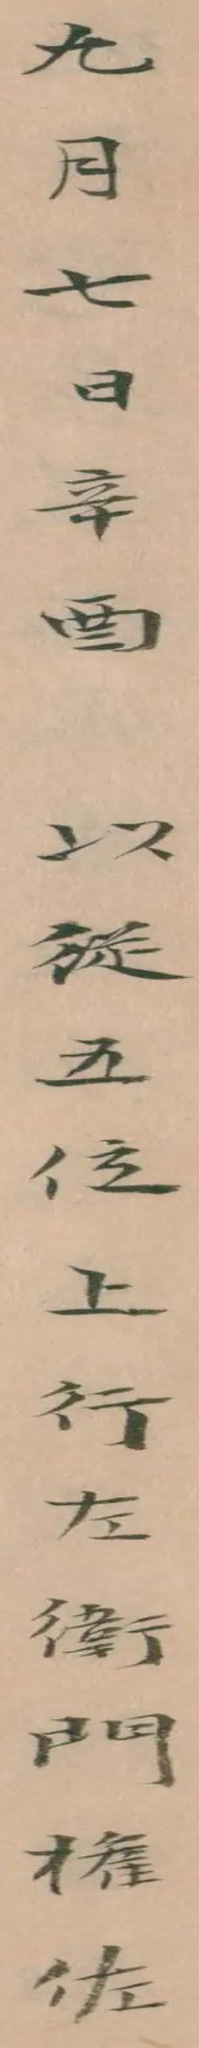九月七日辛酉以従五位上行左衛門権佐
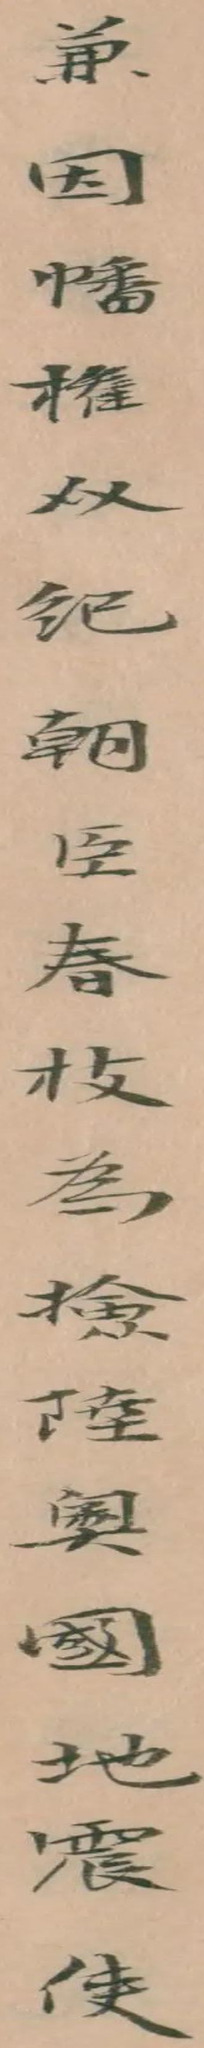兼因幡権介紀朝臣春枝為検陸奥国地震使
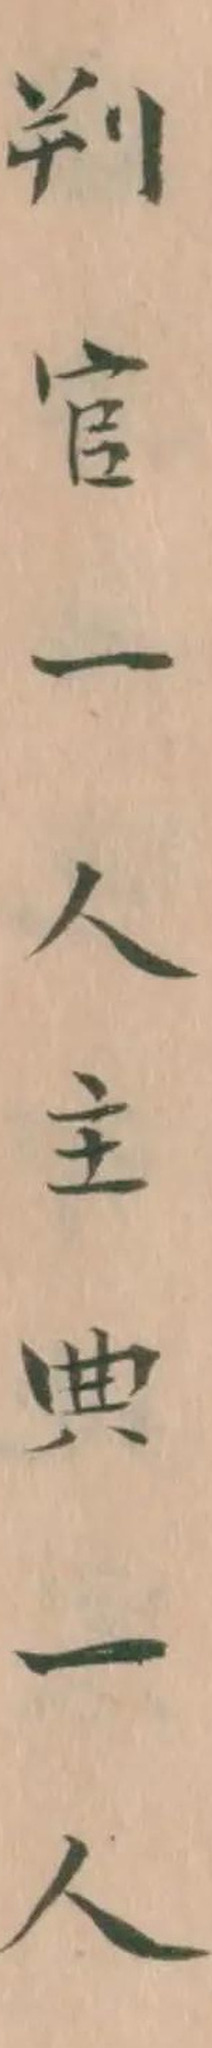判官一人主典一人

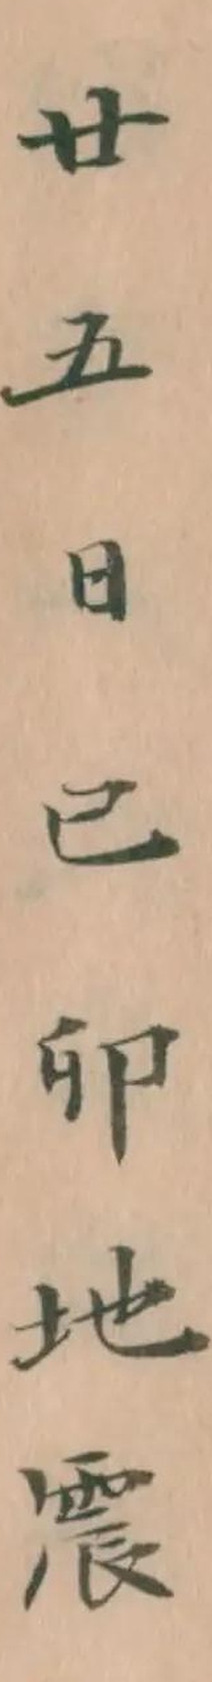廿五日己卯地震
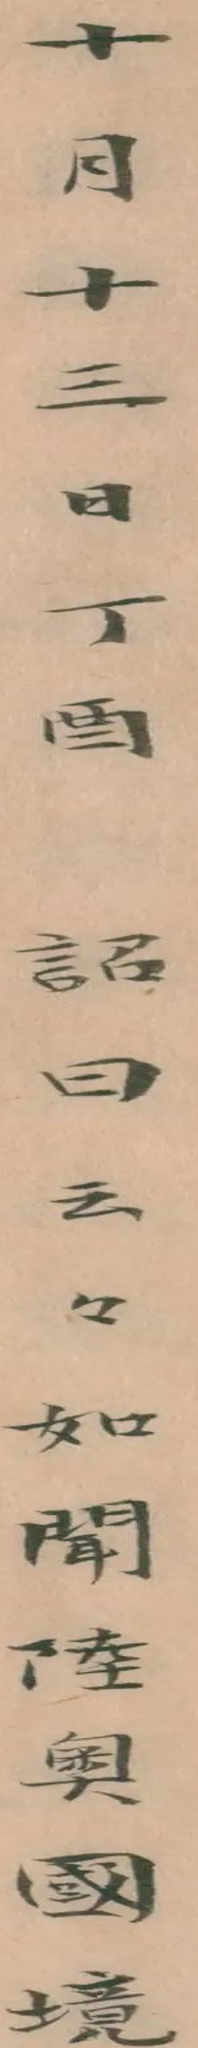十月十三日丁酉詔曰云々如聞陸奥国境
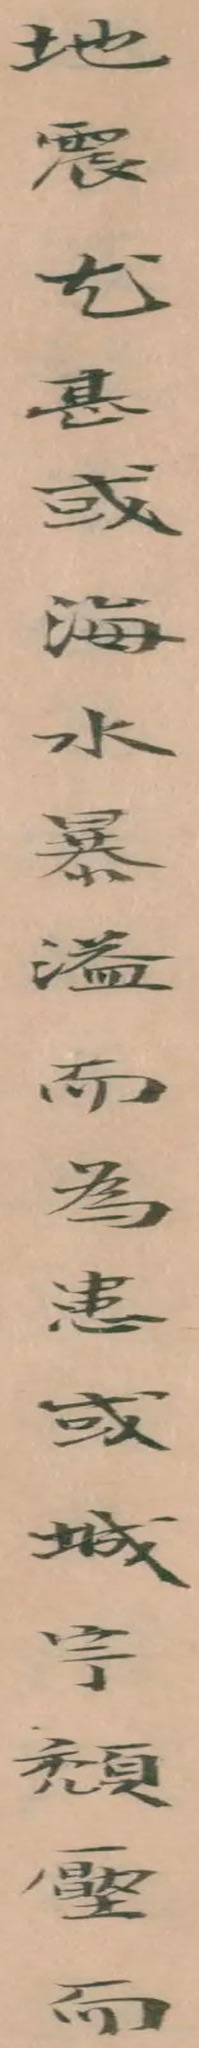地震尤甚或海水暴溢而為患或城宇頽圧而
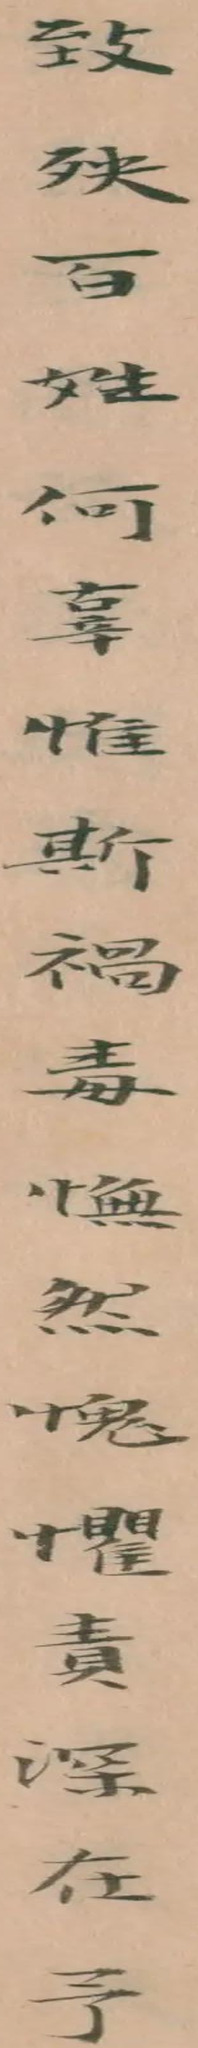致殃百姓何辜惟斯禍毒憮然愧懼責深在予
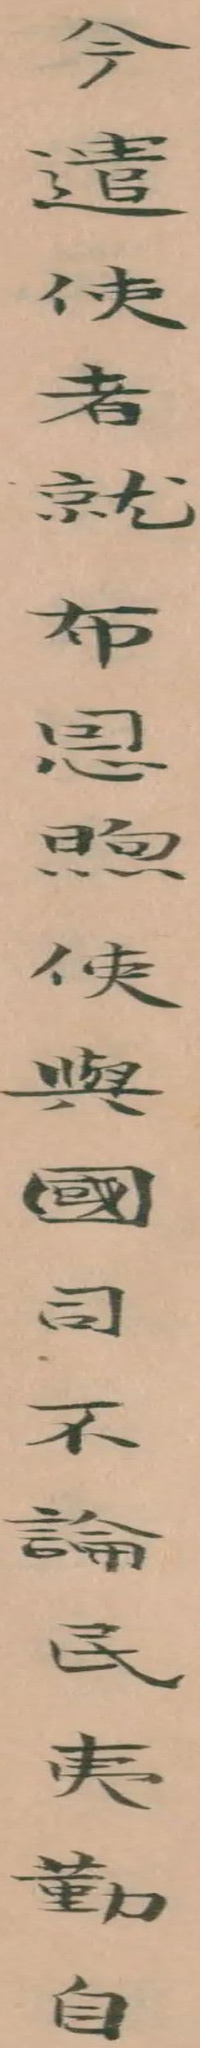今遣使者就布恩煦使與国司不論民夷勤自
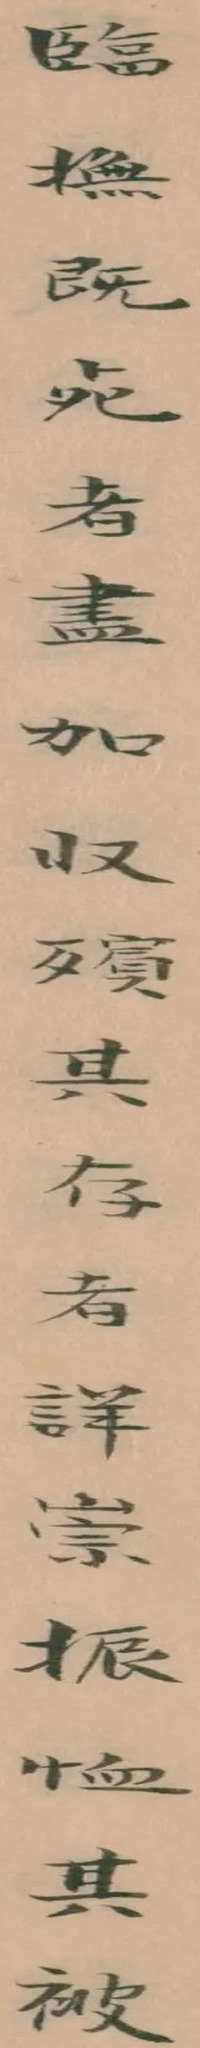臨撫既死者尽加収殯其存者詳崇振恤其被
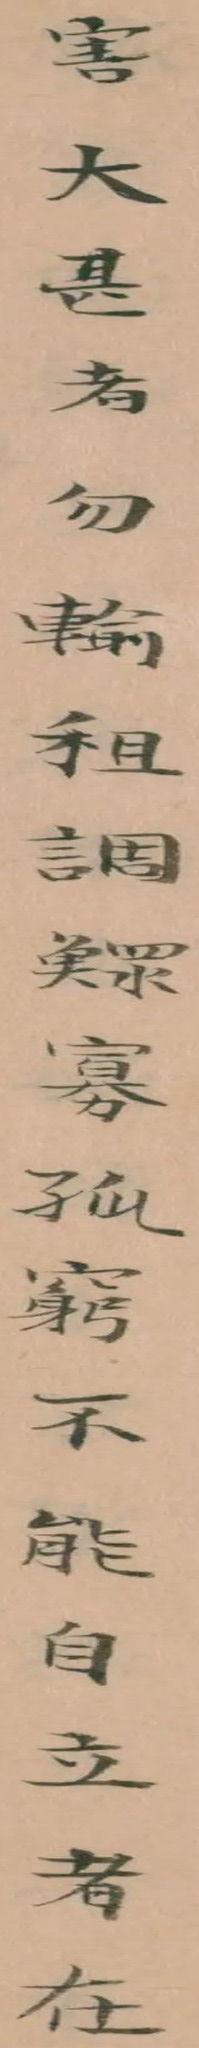害大甚者勿輸租調鰥寡孤窮不能自立者在
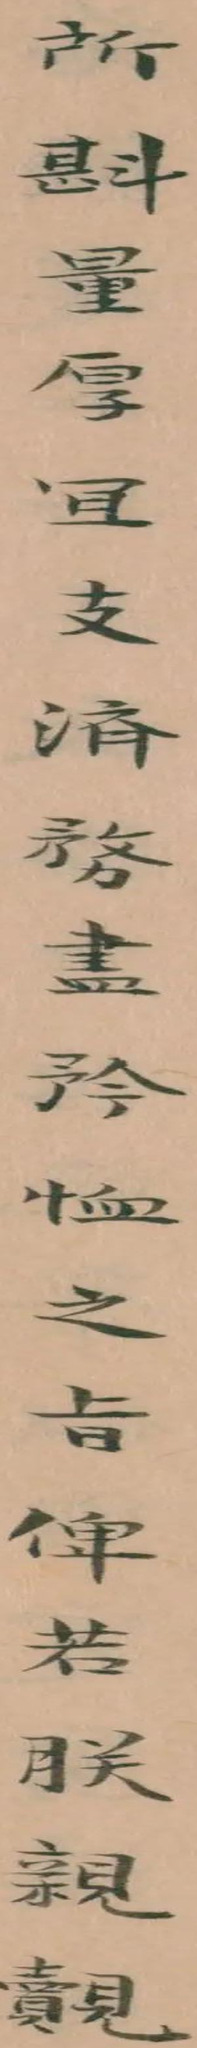所斟量厚宜支済務尽矜恤之旨俾若朕親覿
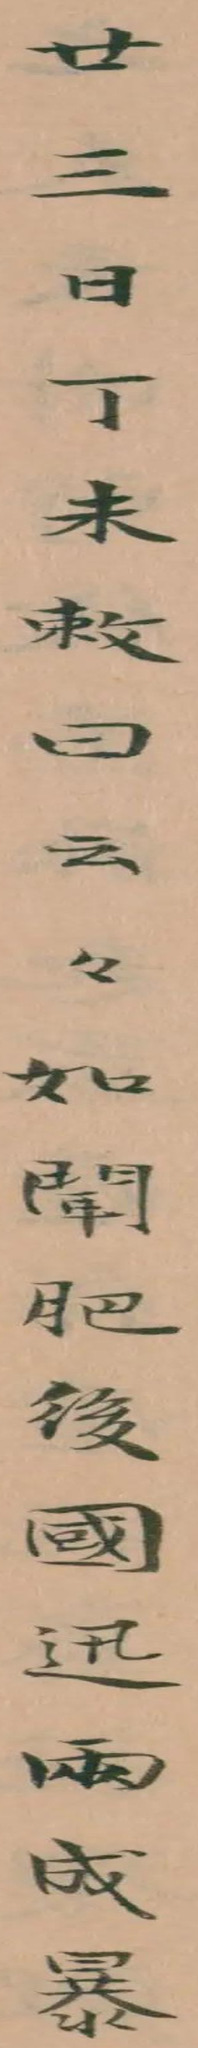廿三日丁未敕曰云々如聞肥後国迅両成暴
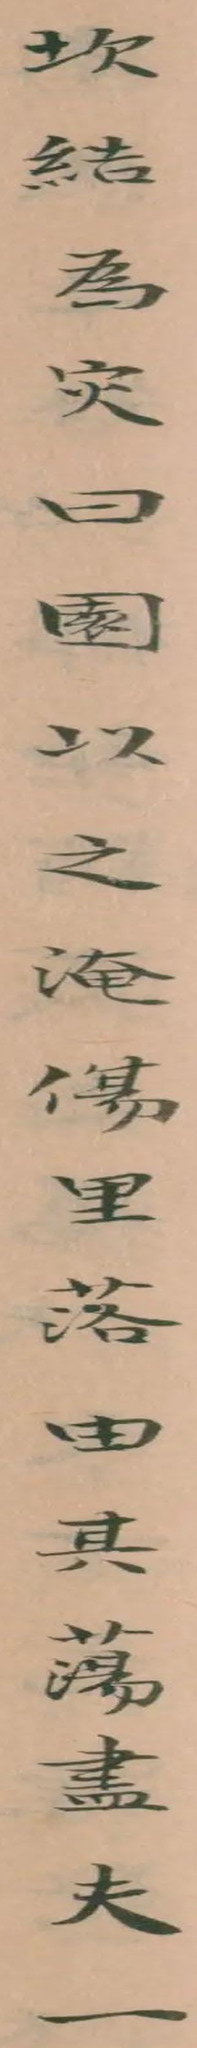坎結為災曰園以之淹傷里落由其蕩尽夫一
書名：地災撮要. 巻5-6(地震之部)
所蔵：国立国会図書館 National Diet Library, JAPAN
